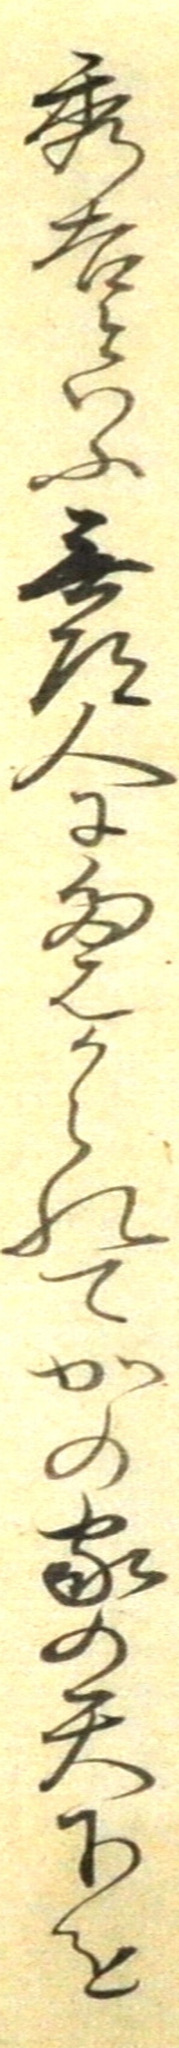秀吉といふ無道に與にたはかられてかの家の天下を
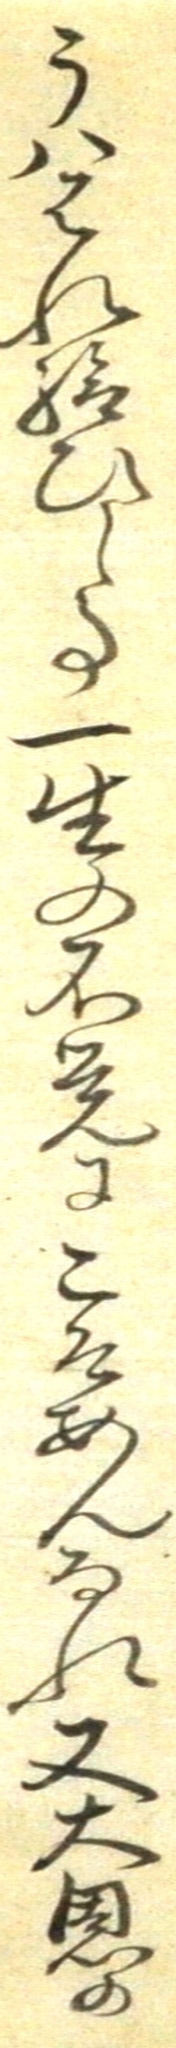うははれ給ひし事一生の不覚にこそあんなれ又大恩の
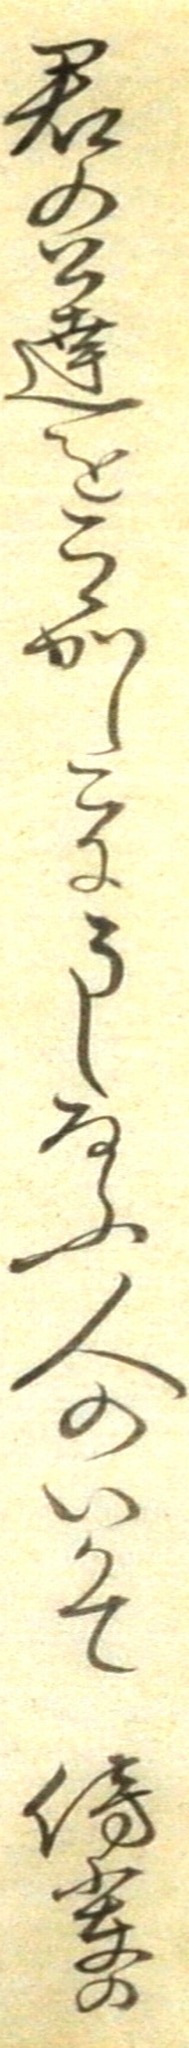君の公達をこゝかしこにうしなふ人のいかて侍輩の
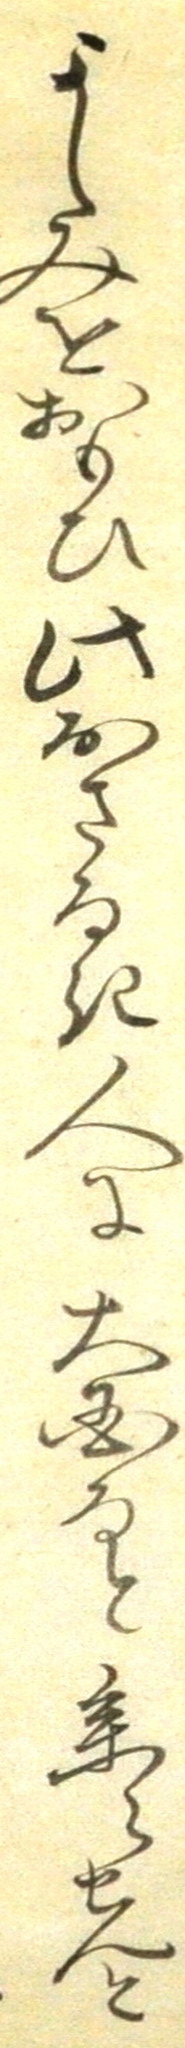よしみをおもひ此おさなき人に大国なと参らせんと
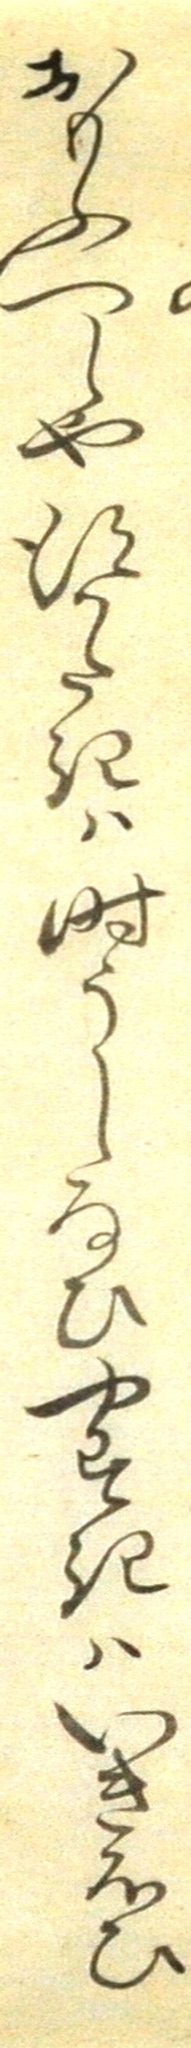おもふへしや得かたきは時うしなひやすきはいきほひ
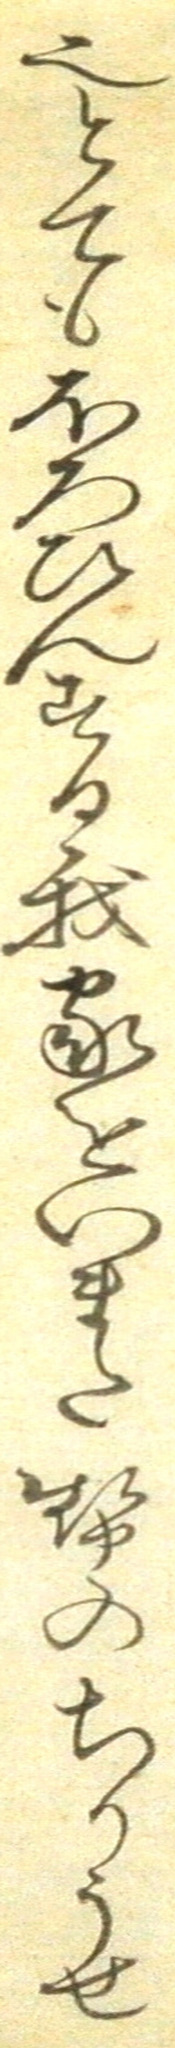也とてもほろひんする我家をいまた勢のちりうせ
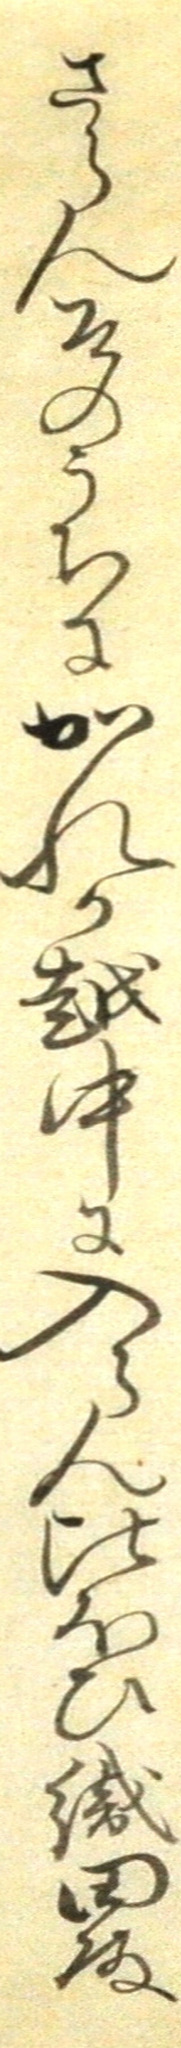さらんそのうちにかれか越中に入らん比ほひ織田殿
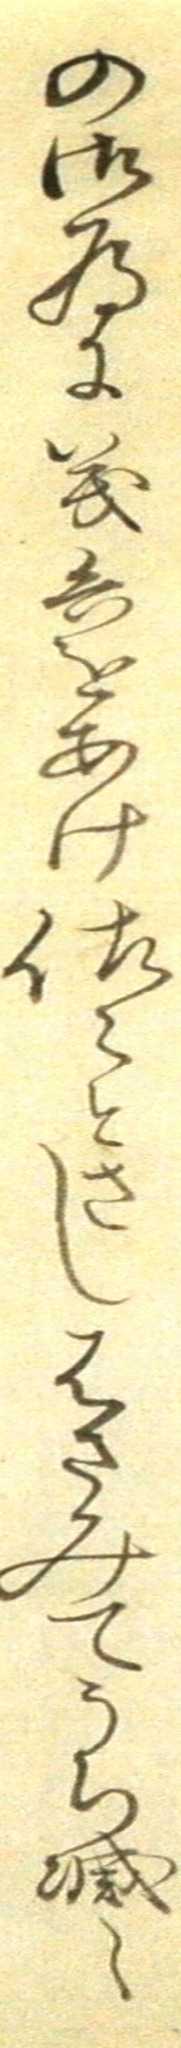の御為に義兵をあけ佐々とさしはさみてうち滅し
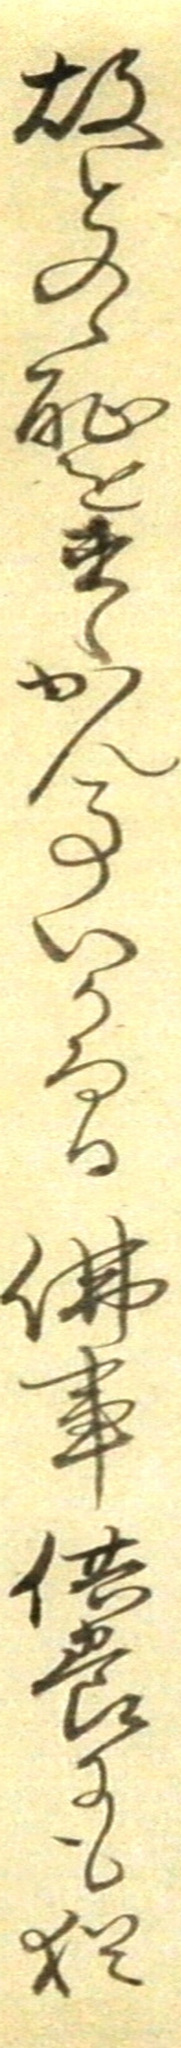故とのゝ恥をすゝかん事いかなる仏事供養にも猶
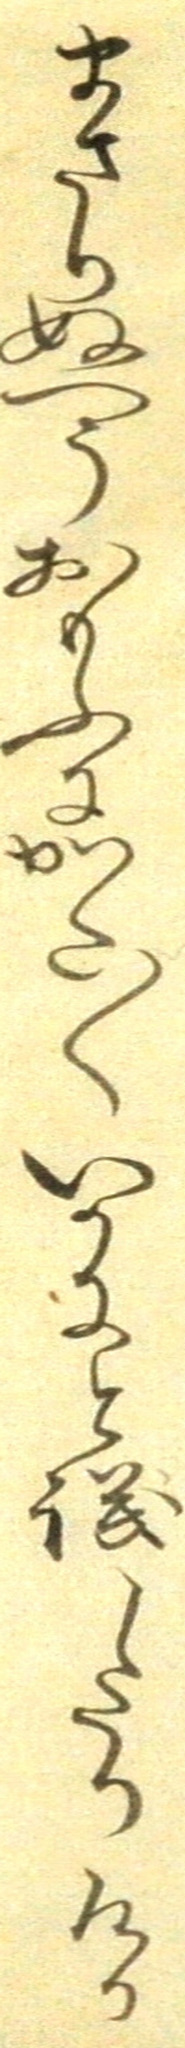まさりぬへうおもうにかた〳〵いかにと儀したりけり
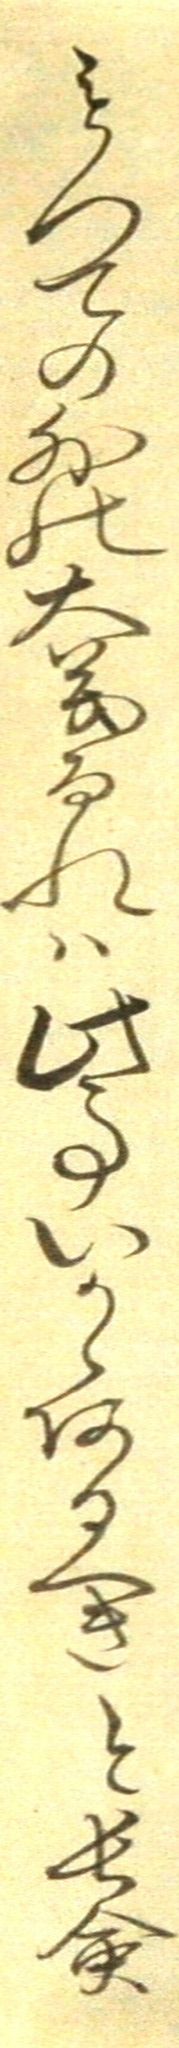もつての外の大義なれは此事いかゝあるへきと長僉

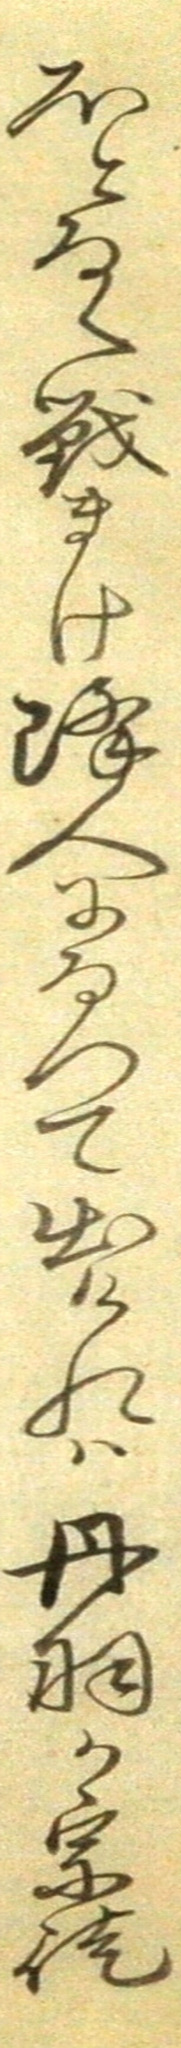ほとなく戦まけ降人になつて出けれは丹羽か宗徒
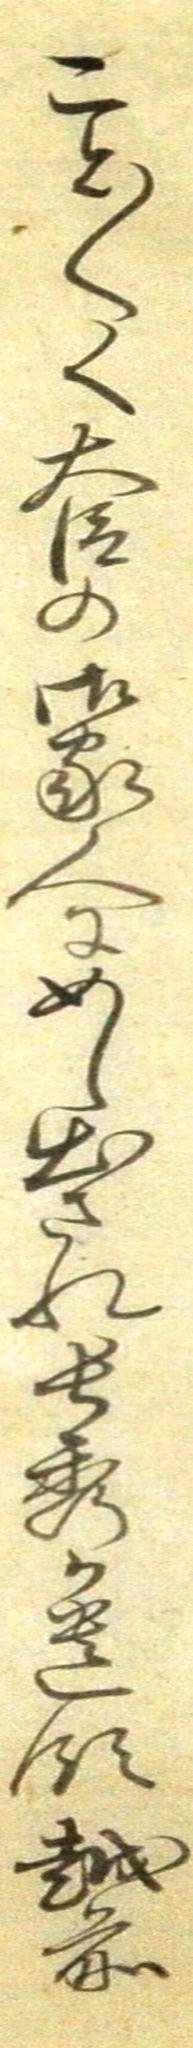こと〳〵く大臣の御家人にめし出され長秀か遺領越前
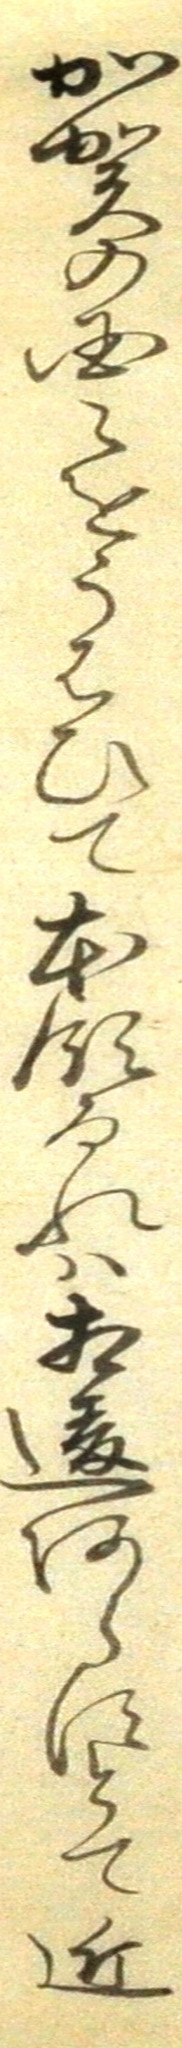加賀の国々をうはひて本領なれは相違あらすとて近
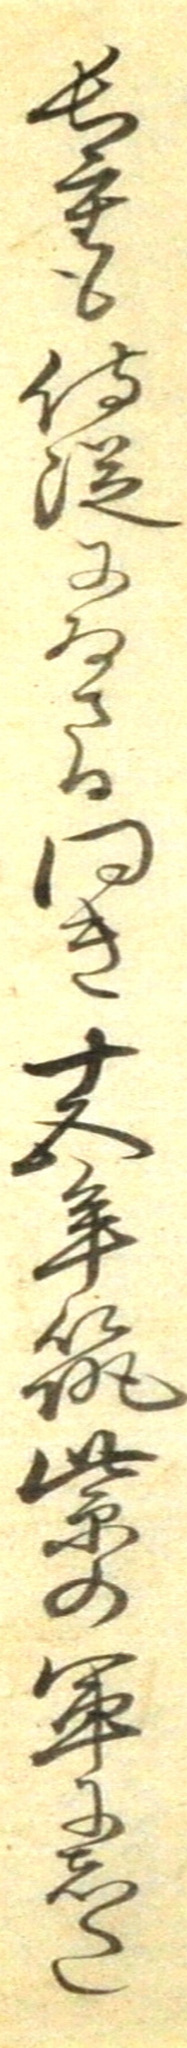長重も侍従になさる同き十五年筑紫の郡にした
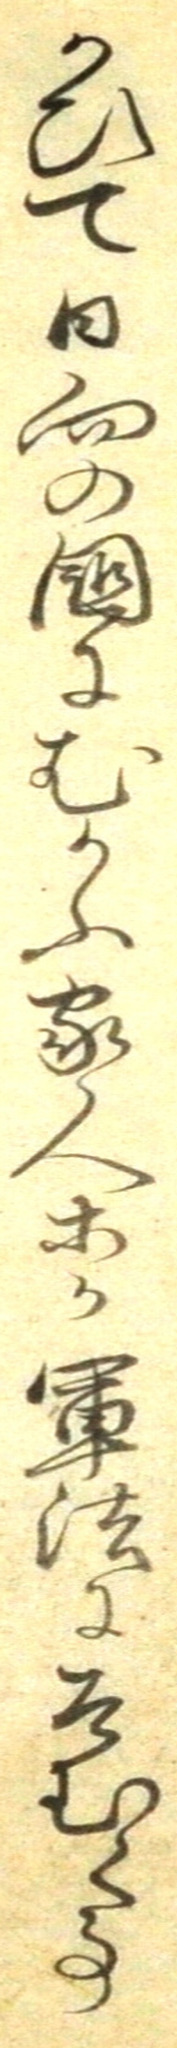かひて日向の国にむかふ家人等か軍法にそむく事
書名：藩翰譜（八・下）
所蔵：伊那市立高遠町図書館・合同会社AMANE
